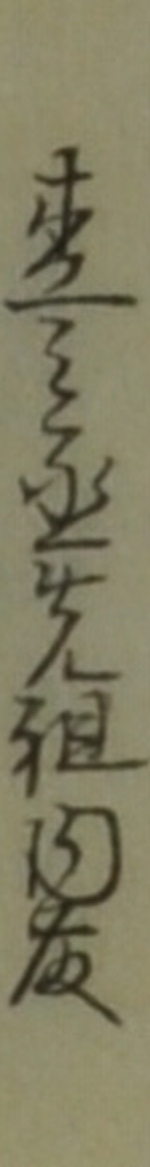杢之丞先祖内藤
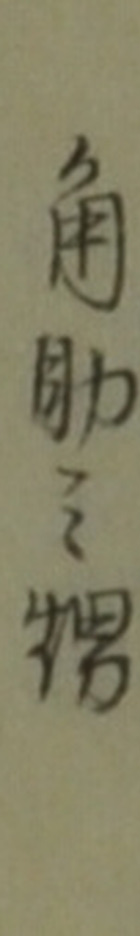角助之甥
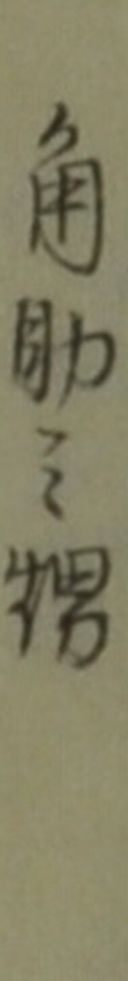角助之甥
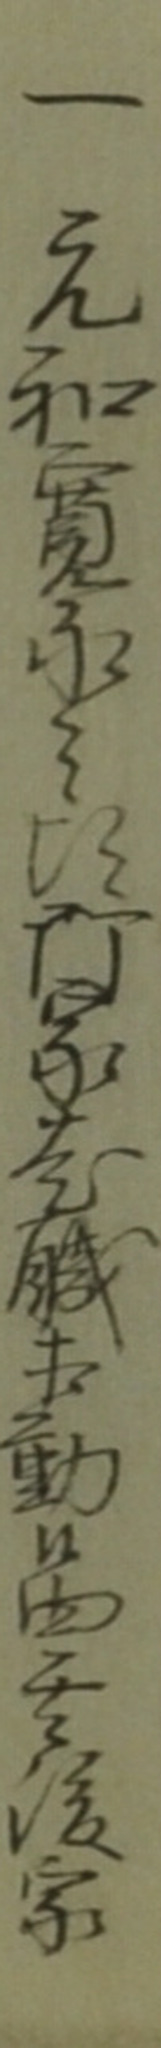一元和寛永之頃御家老職相勤候由其後家
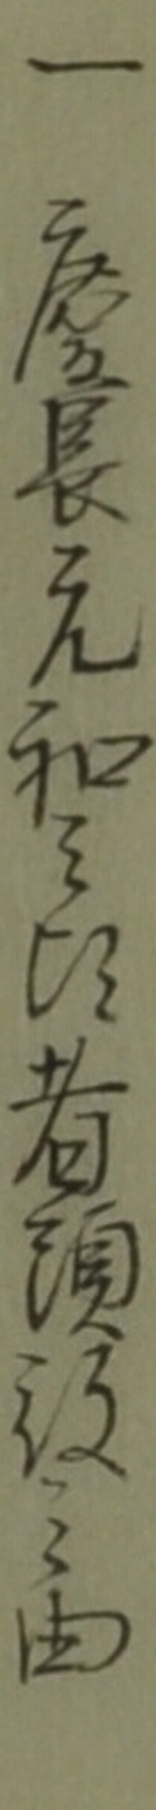一慶長元和之頃者預役之由
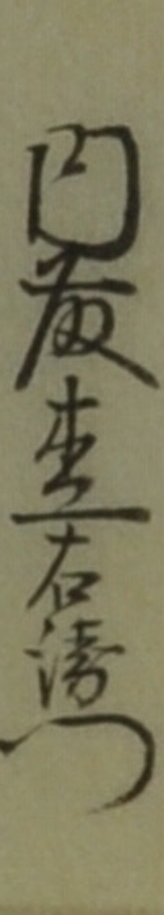内藤杢右衛門
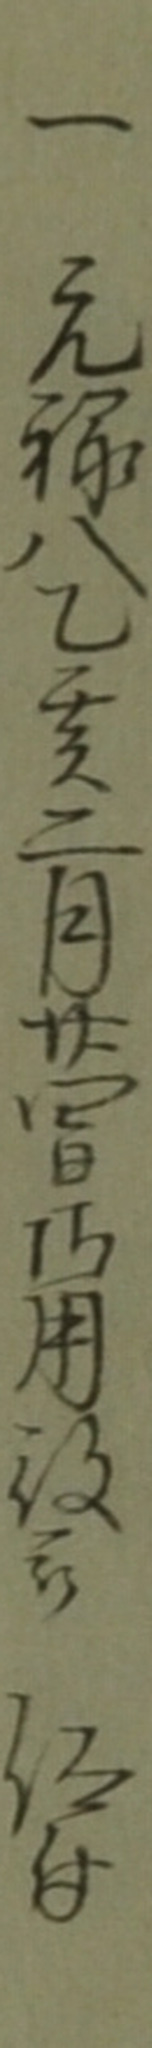一元禄八乙亥二月廿四日御用役被仰付
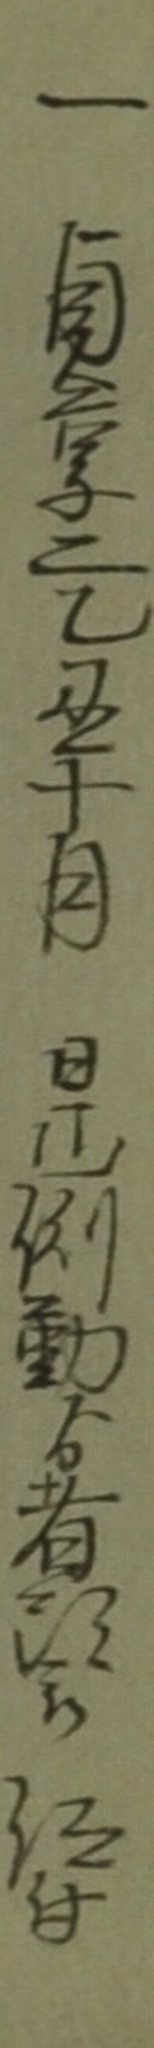一貞享二乙丑十月日御側勤ゟ者頭被仰付
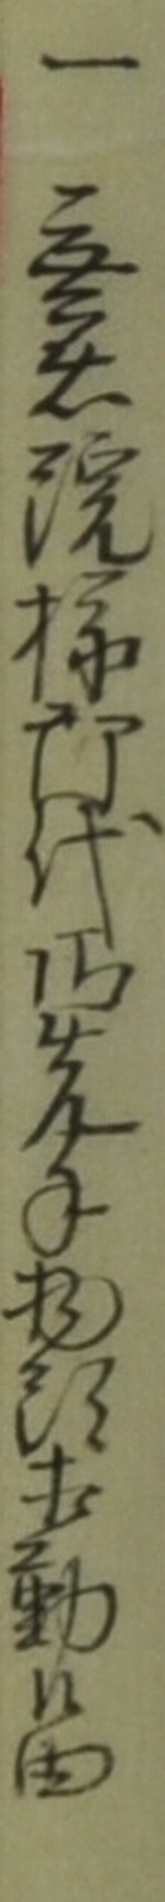一無着院様御代御先手物頭相勤候由
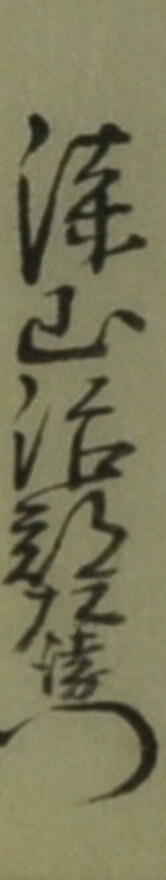津山治部左衛門

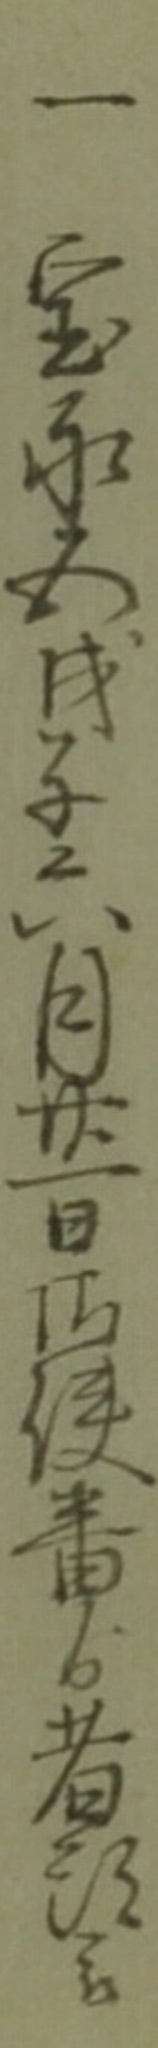一宝永五戊子六月廿一日御使番ゟ者頭被
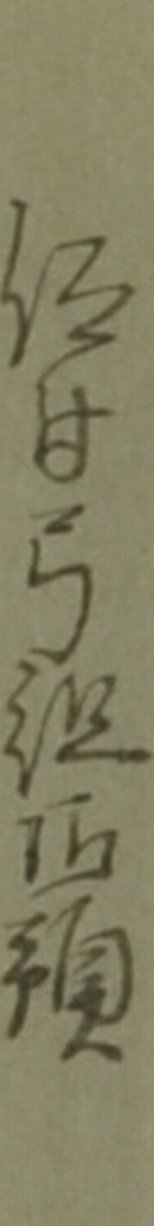仰付弓組御預
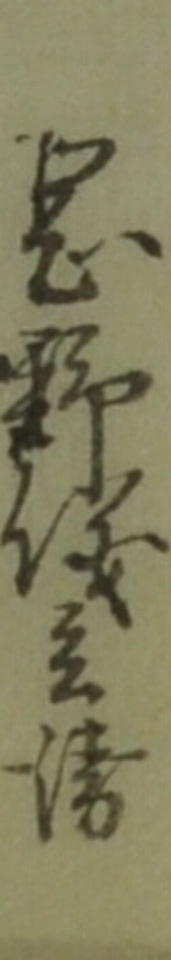岡野儀兵衛
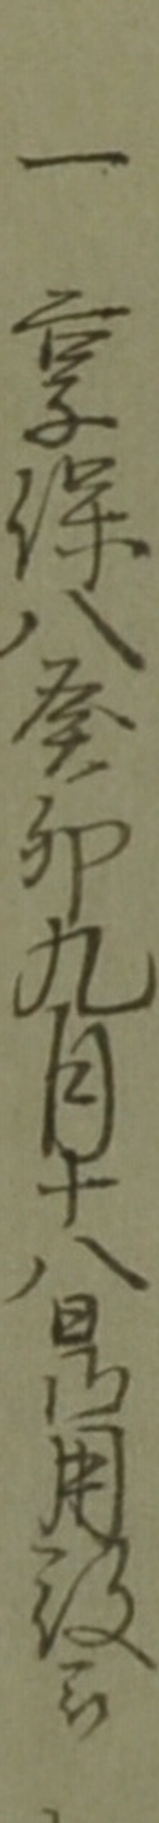一享保八癸卯九月十八日御用役被仰付
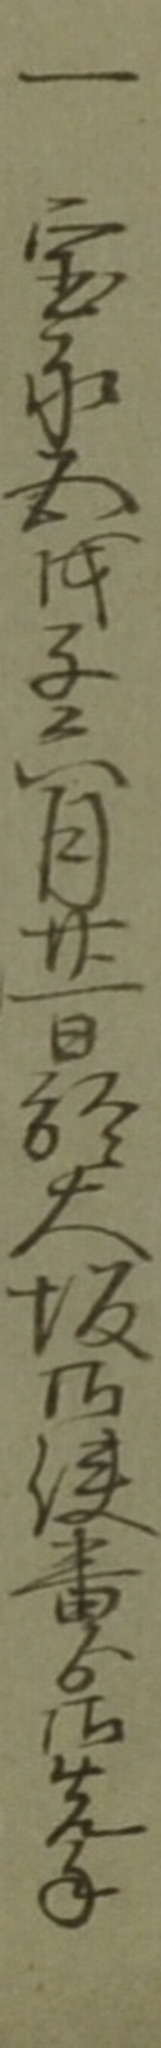一宝永五戊子六月廿一日於大坂御使番ゟ御先手
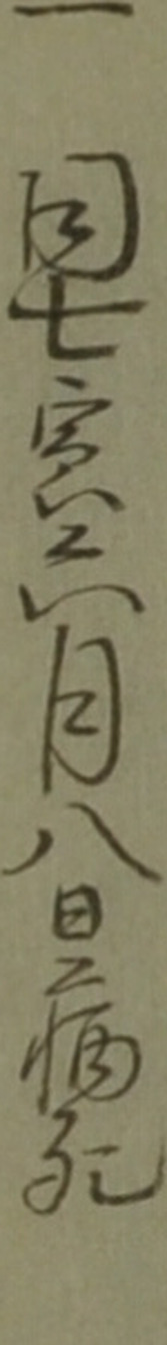一同七寅六月八日病死
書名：諸御役代々録（二）
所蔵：伊那市立高遠町図書館・合同会社AMANE
